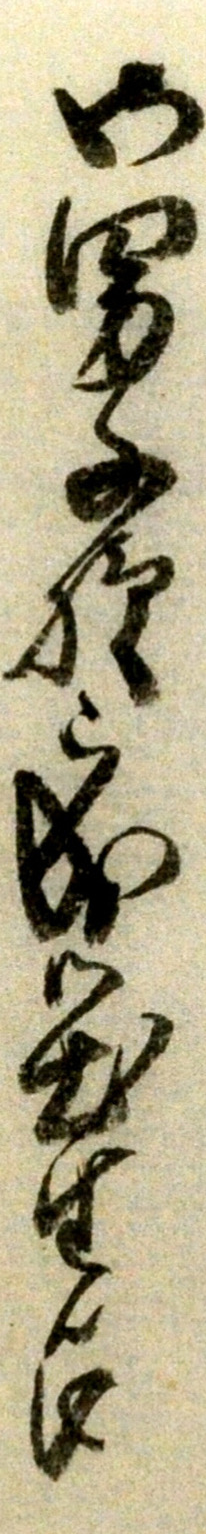御男子様被成御出生候由
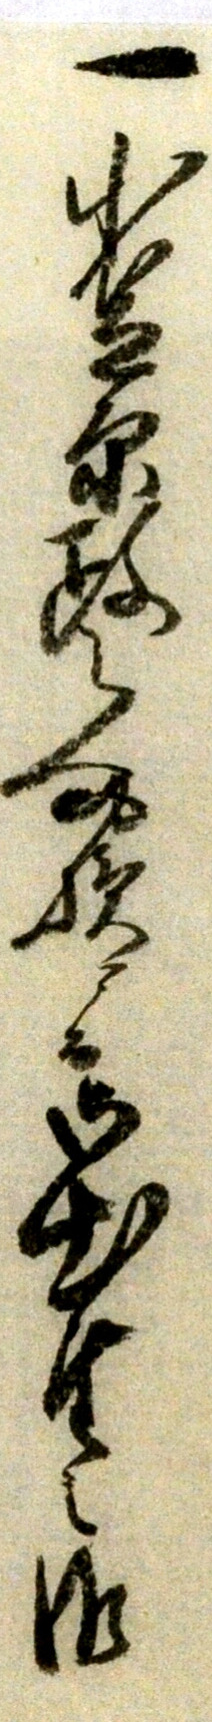一小笠原政之介様にて御出生之御
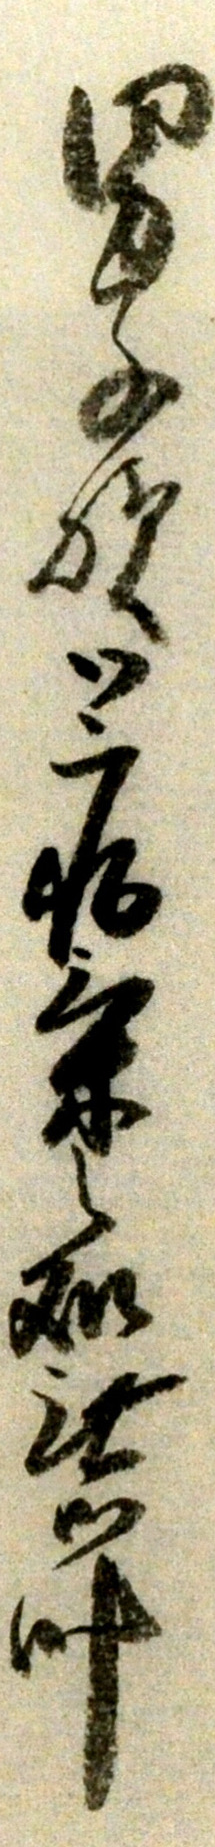男子様御病気之処無御叶

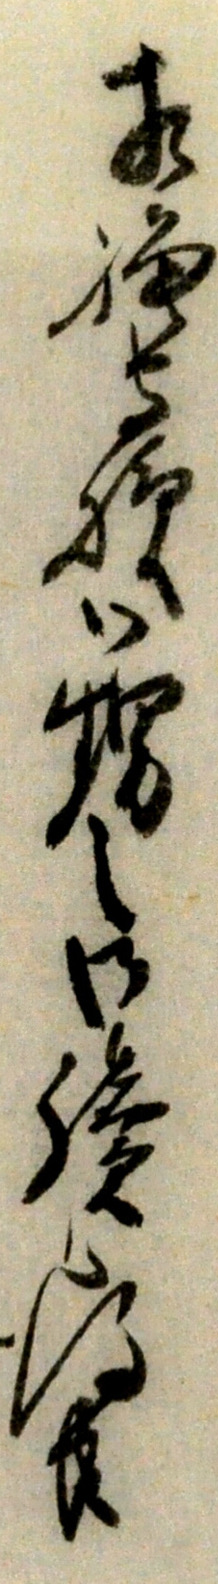相模守様御甥之御続候得共
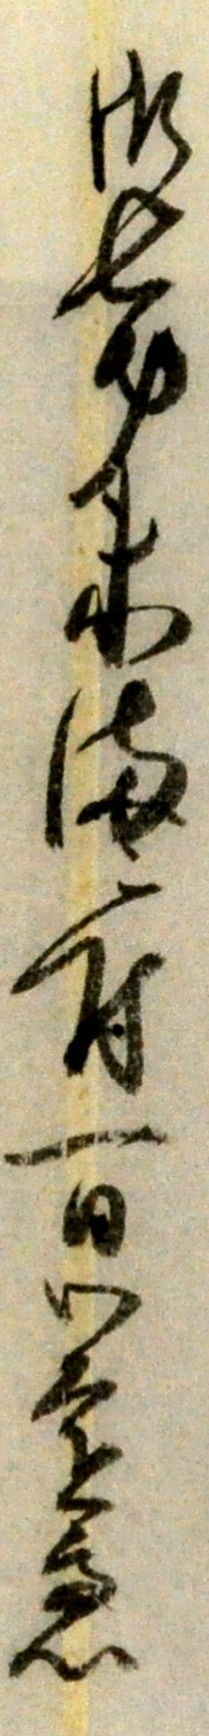御七才未満に付一日御遠慮
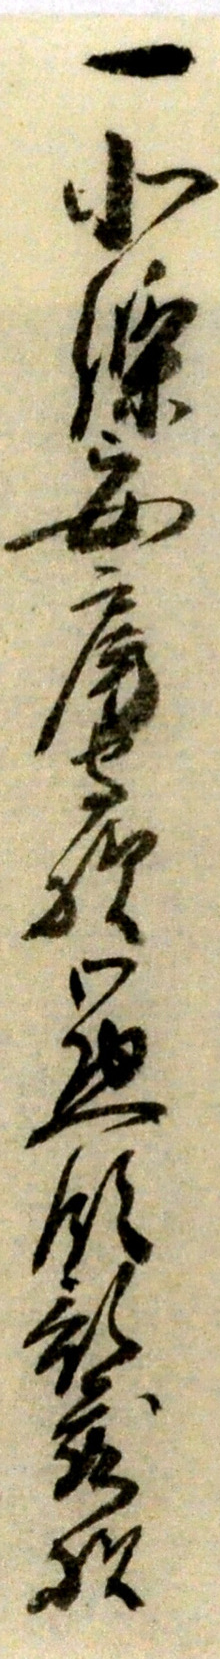一北條安房守様御惣領新蔵様
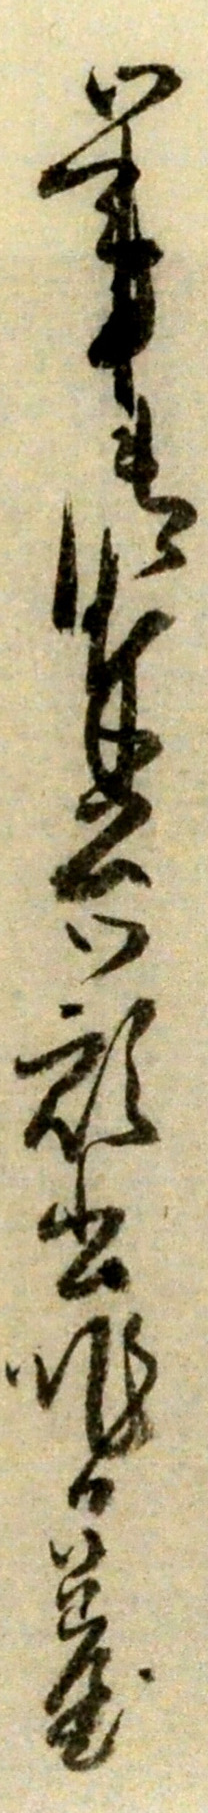御事御奉公御願書昨日差出
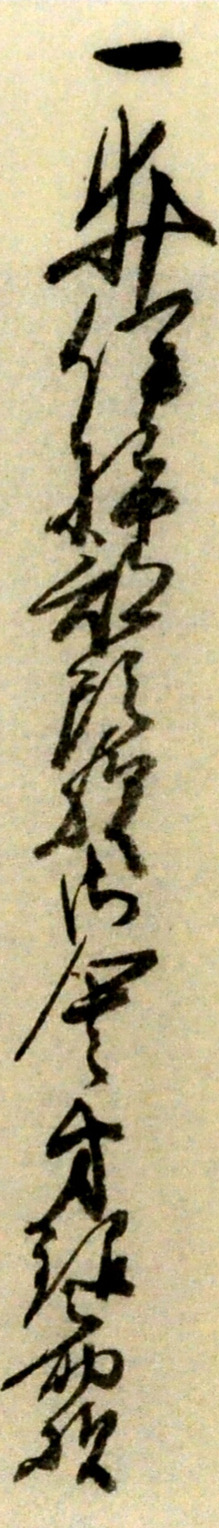一井伊掃部頭様御舎弟銀之助様
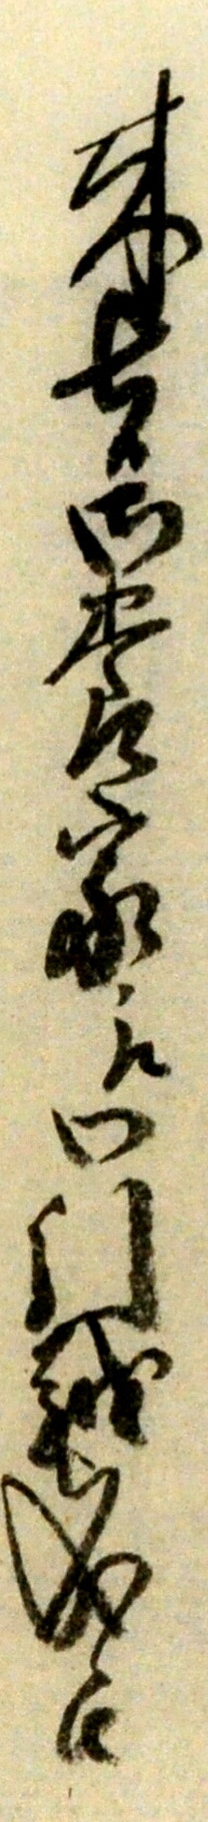来七日御養家え御引越被成候由
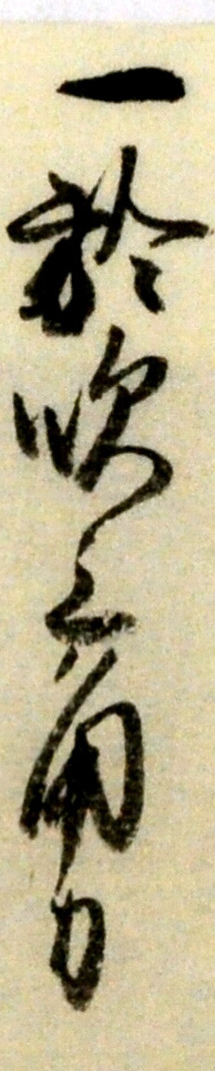一於吹上角力
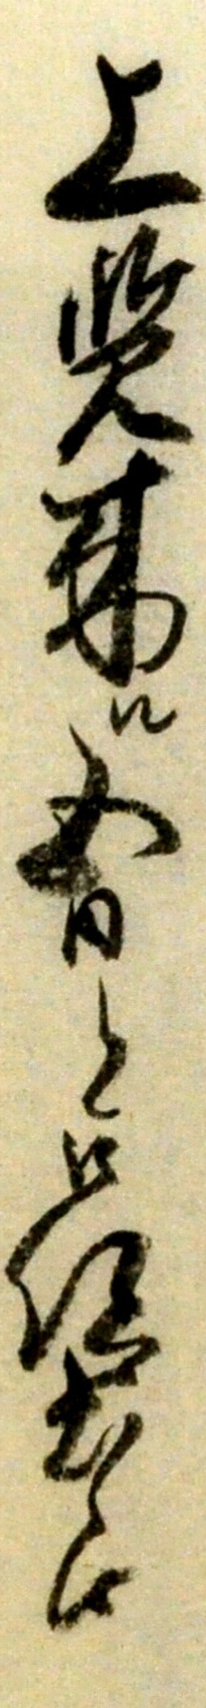上覧来ル五日と被仰出候由
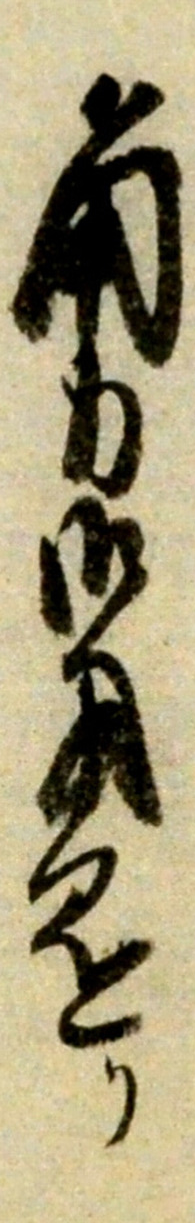角力御用懸り
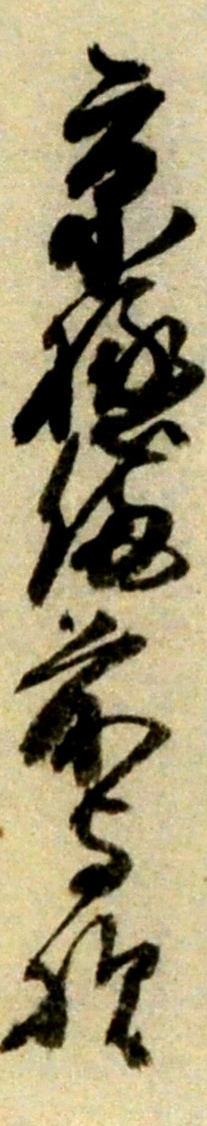京極備前守様
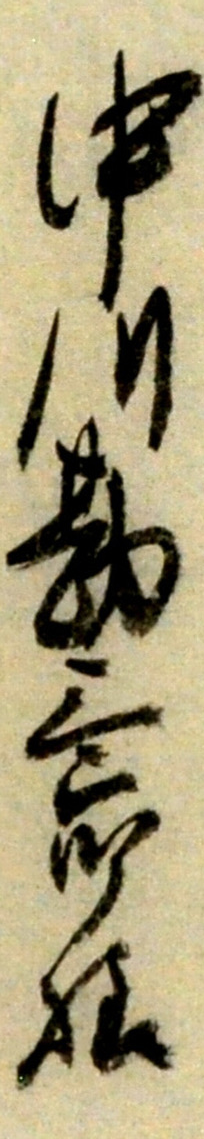中川勘三郎様

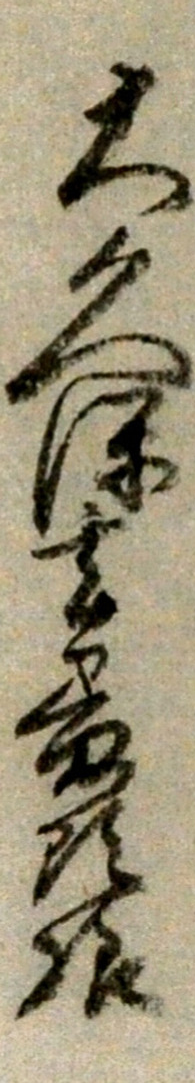大久保玄蕃頭様
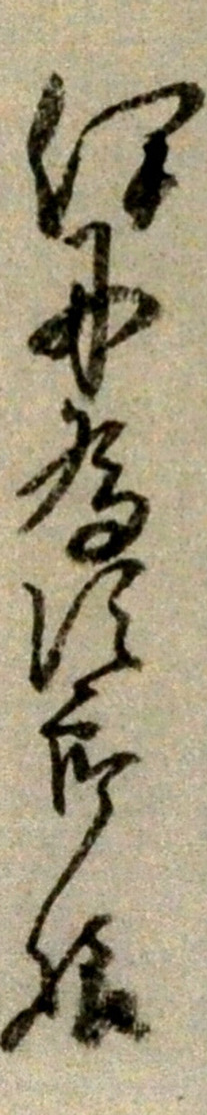伊丹為次郎様
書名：申合帳〔一括〕
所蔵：伊那市立高遠町図書館・合同会社AMANE
